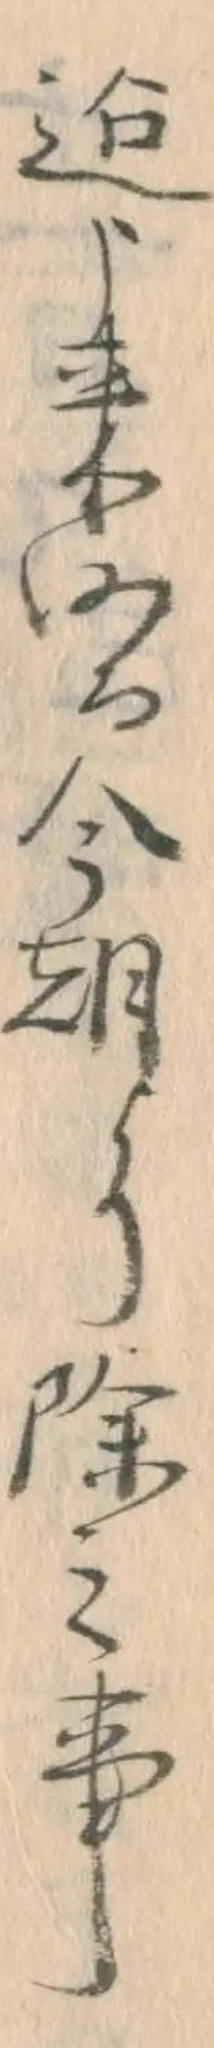迄申来仍而今朝より除之事
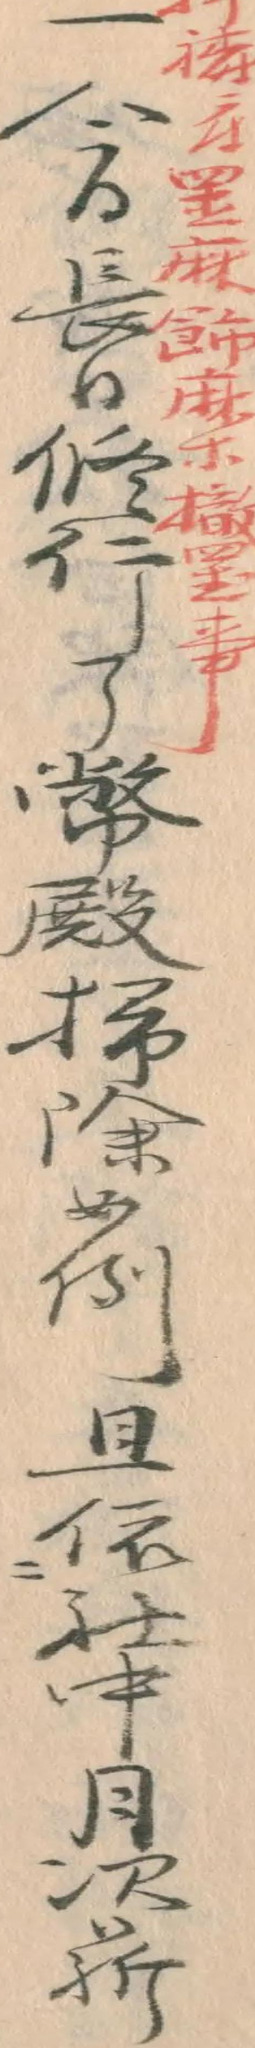一今日長日修行了幣殿掃除如例且依社中月次御祈
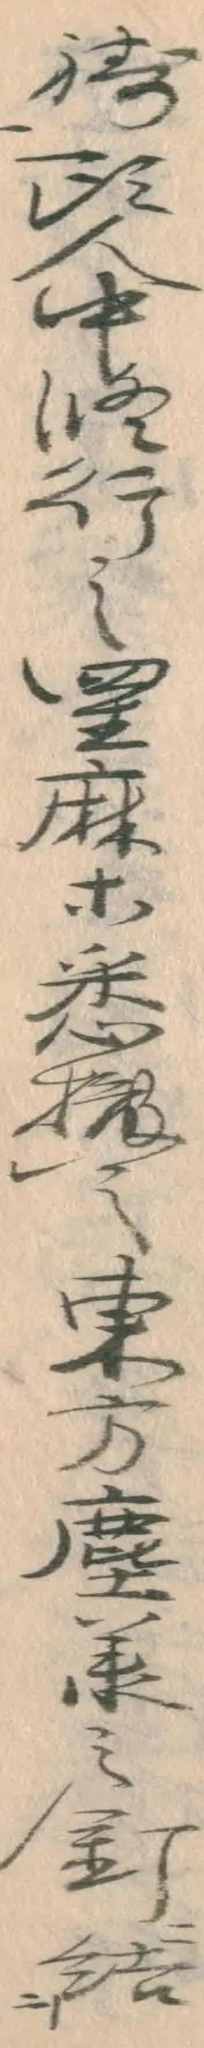祷頭人中修行也置麻等悉撤之東方塵承之釘ニ結
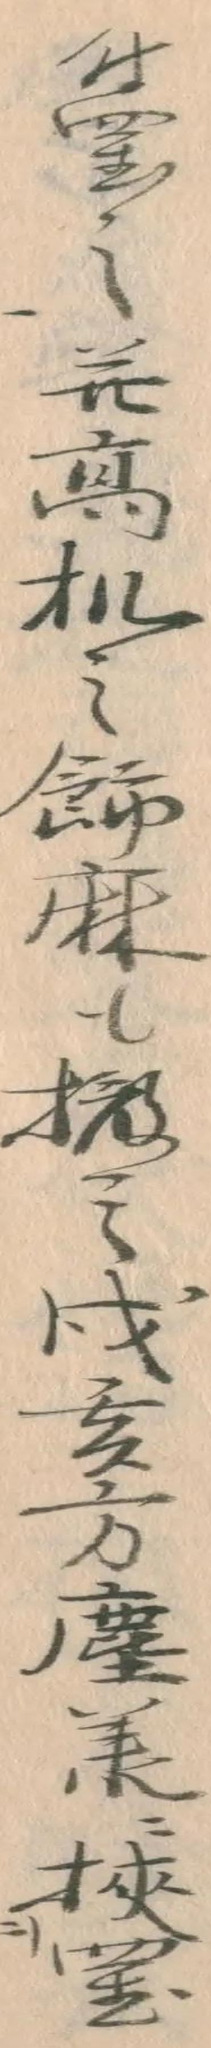付置之并高机之飾麻も撒之戌亥方塵承ニ挟置
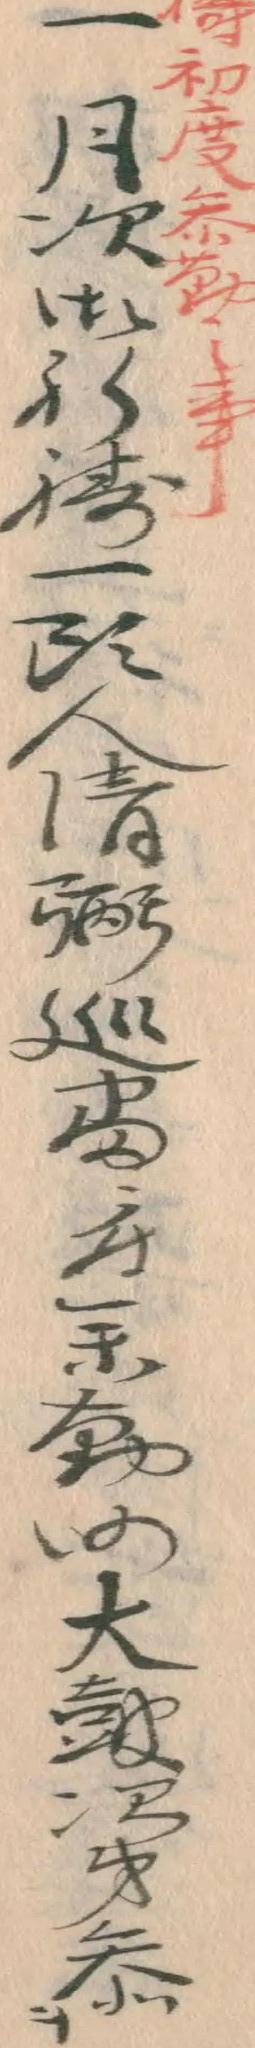一月次御祈祷一頭人清弼巡番ニ付参勤仍大皷次第参勤
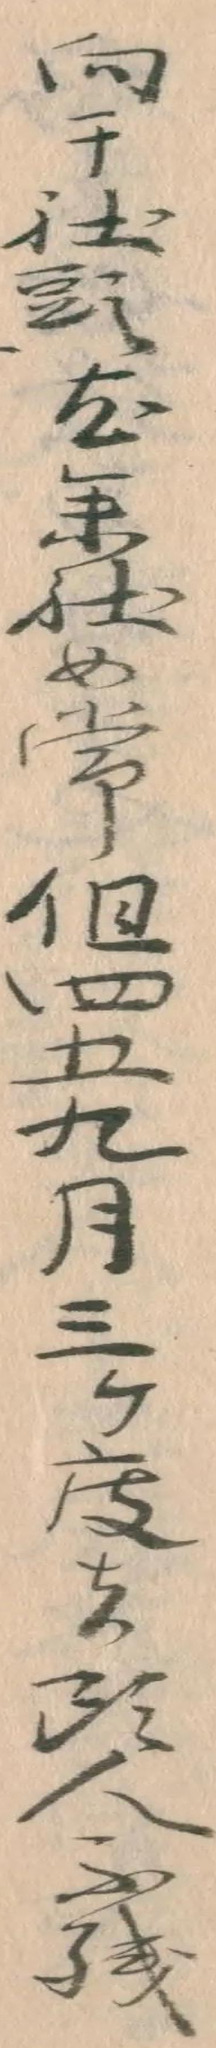向于社頭尤参社如常但四五九月三ケ度は頭人不残
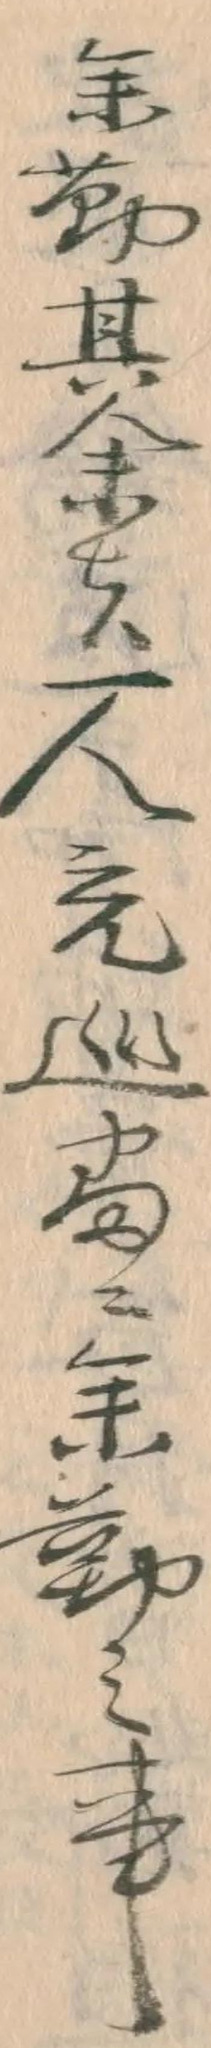参勤其余は一人充巡番に参勤之事
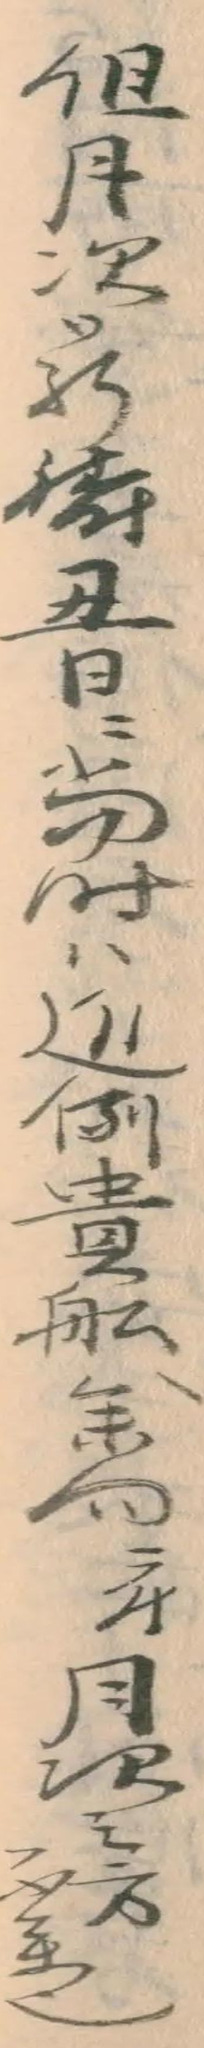但月次御祈祷丑日ニ當時ハ近例貴舩へ参向ニ付月次之方不参也
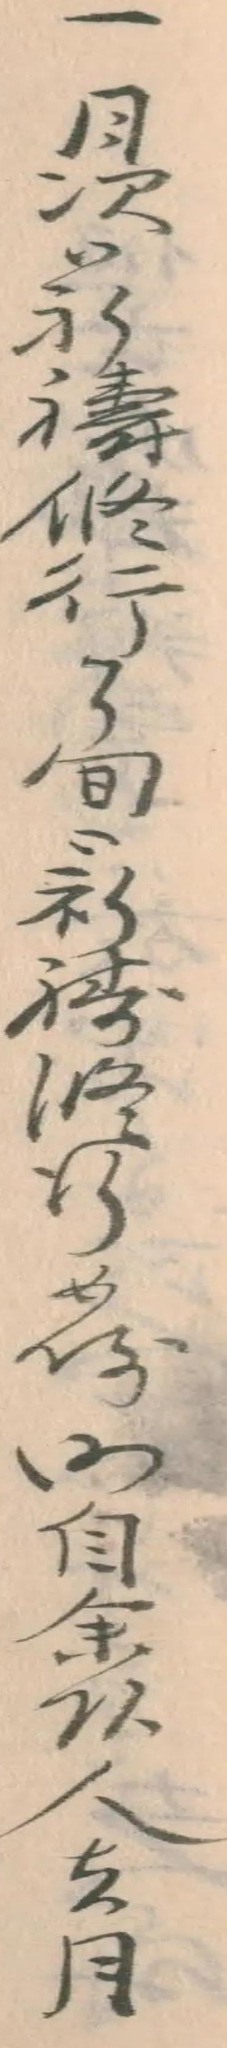一月次御祈祷修行了旬御祈祷修行如例仍自余頭人は月
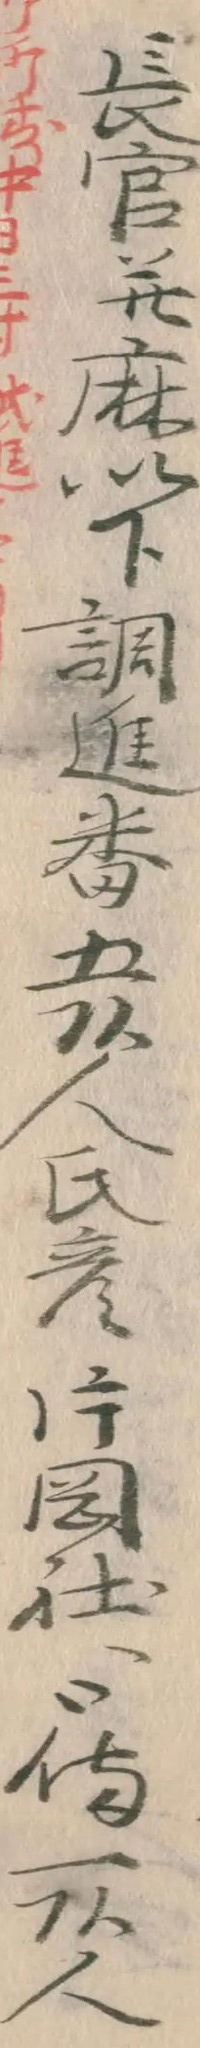長官并麻以下調進番五頭人氏彦片岡社へ御備一頭人
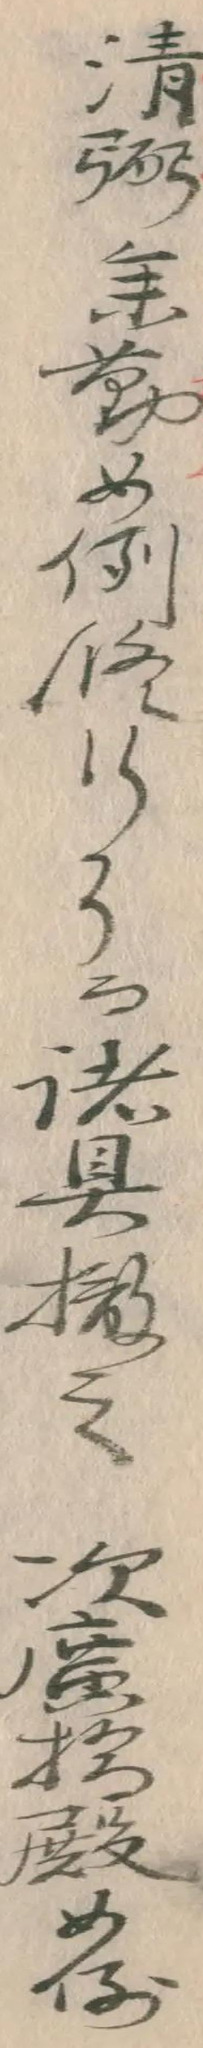清弼参勤如例修行了而諸具撒之次ひ廣橋殿如例
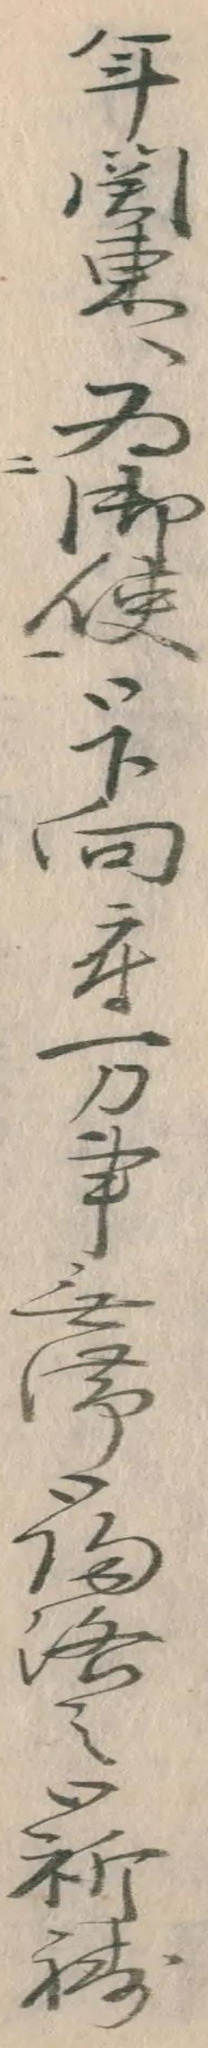年関東へ為御使御下向ニ付万事無滞御帰洛之御祈祷
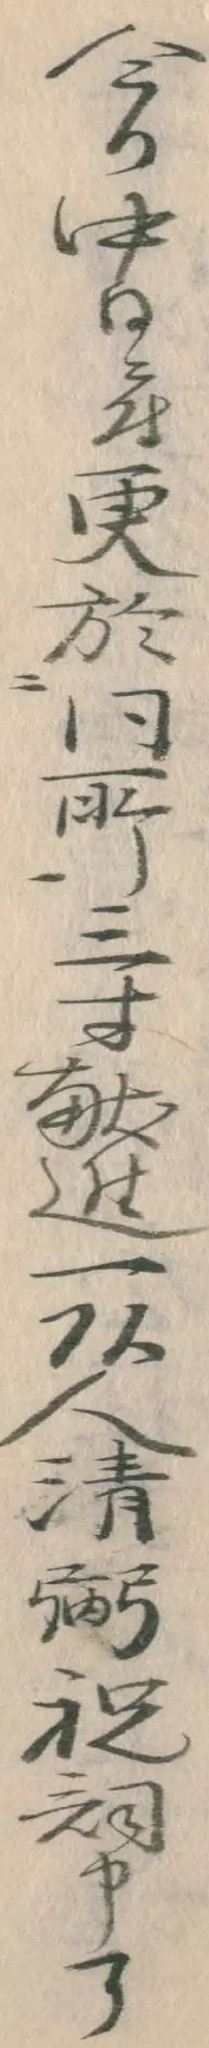今日中日ニ付更於同所三寸献進一頭人清弼祝詞申了
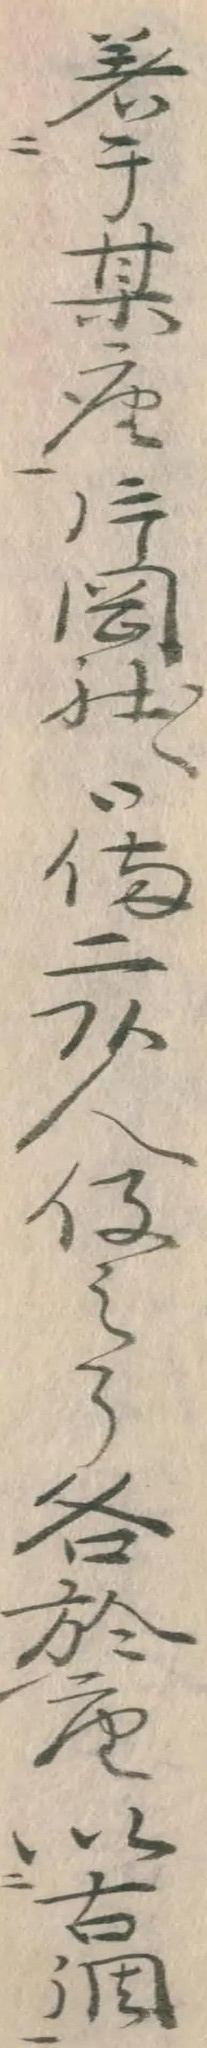着于某座片岡社へ御備二頭人役之了各於座以古調

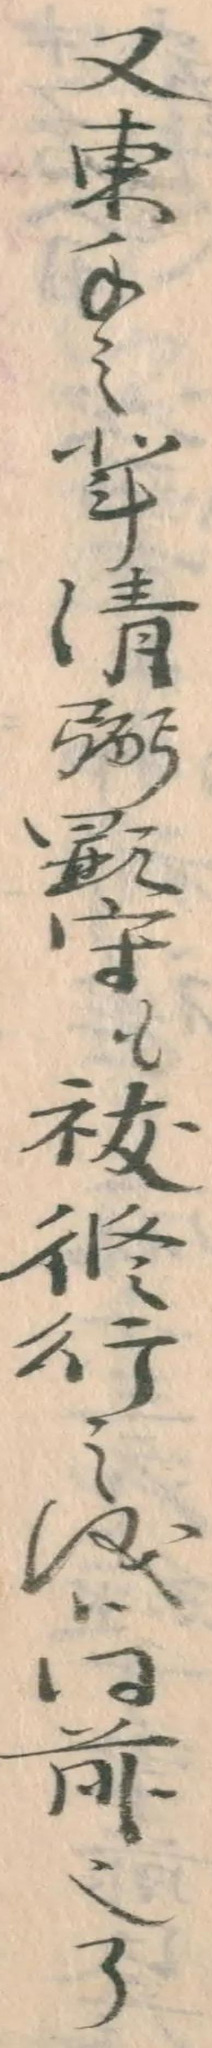又東手之輩清弼顕守も祓修行之儀ハ同前也了
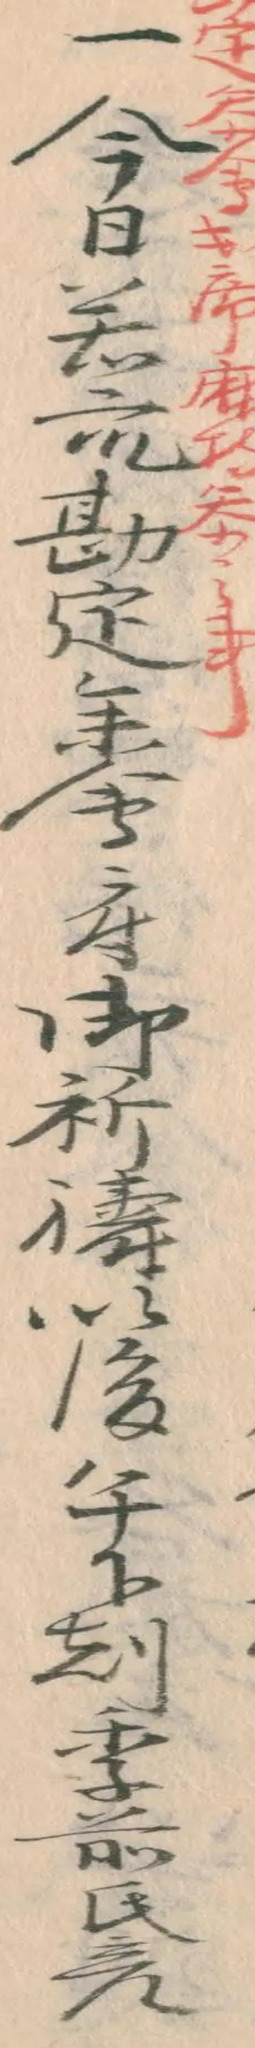一今日若衆勘定参會ニ付御祈祷以後午下刻季前氏彦
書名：賀茂社記録. 第72冊
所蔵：国立国会図書館 National Diet Library, JAPAN
